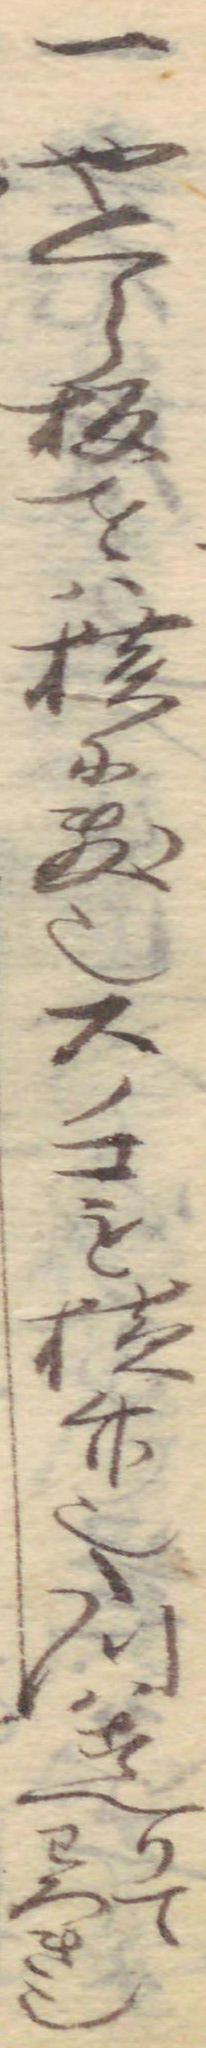一やくら板をハに横に敷也スノコも横竹也たつハすへりてわろき也
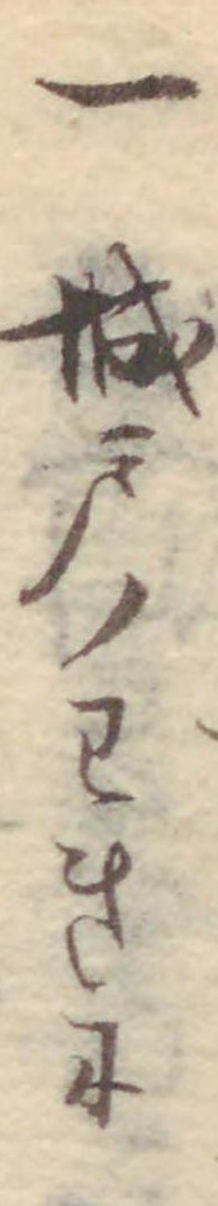一城戸ノわきに
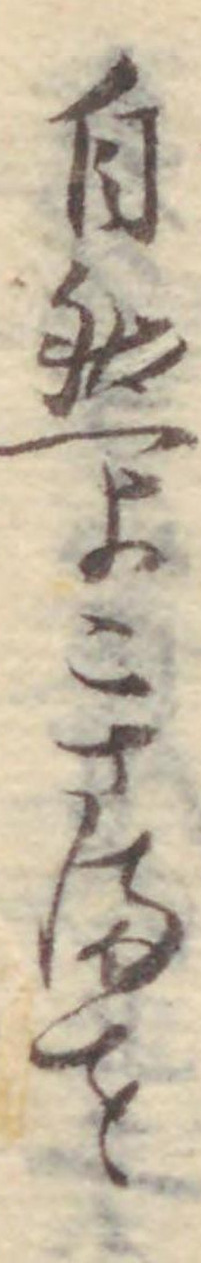自然よこさまを
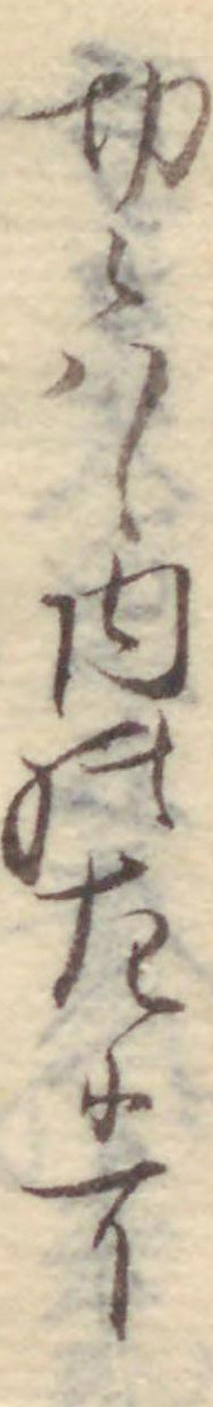切候はゝ内の左に可
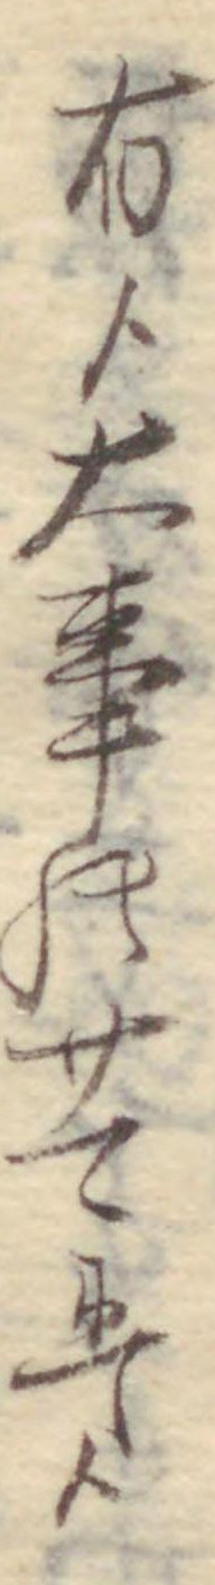有候大事のサマにて候
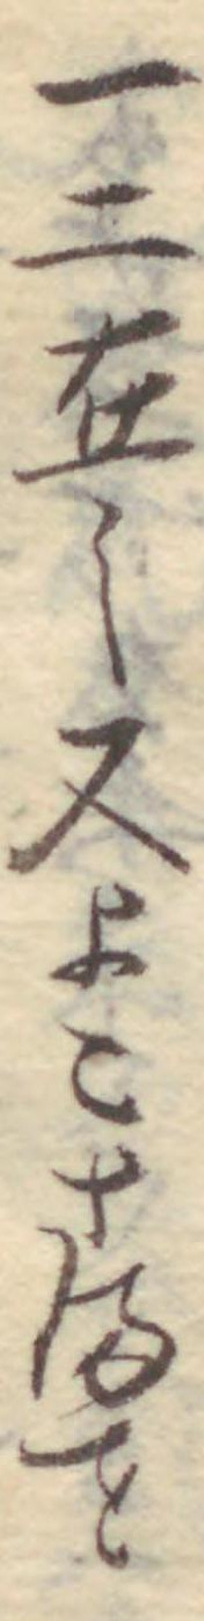一二在之又よこさまを
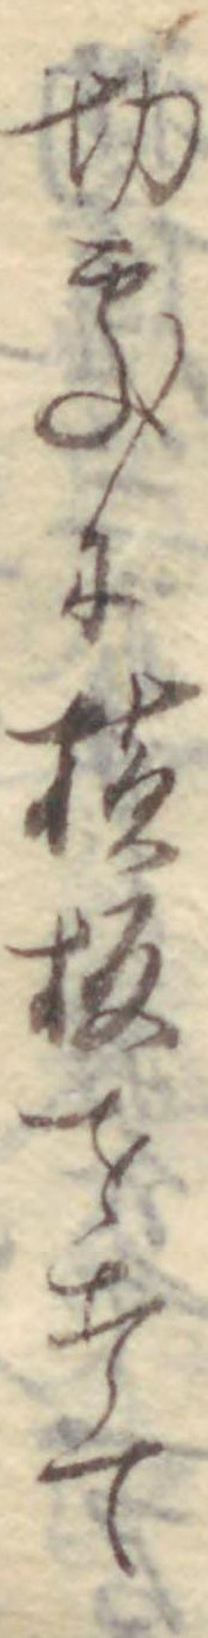切處に横板を打て
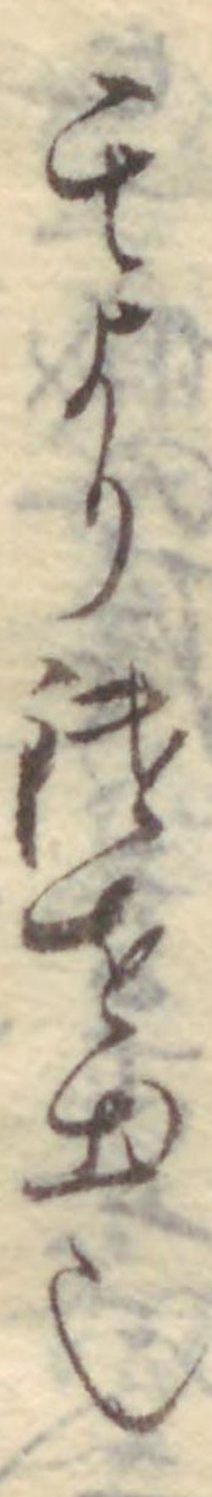其より鑓を出也
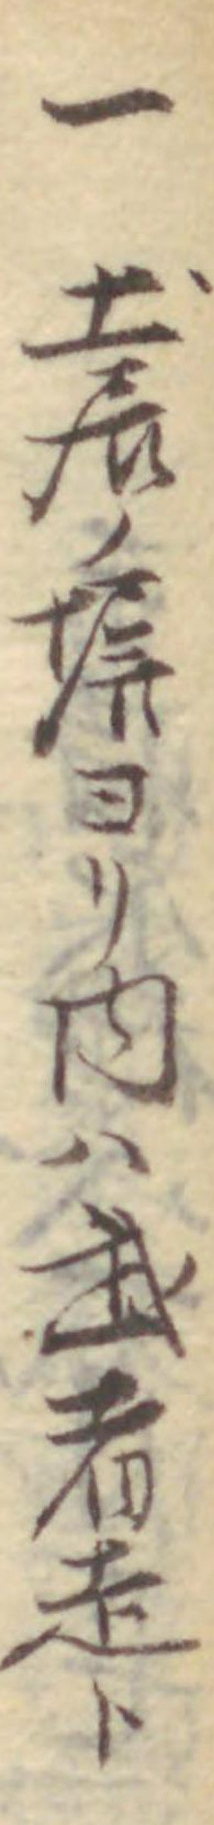一土居ノ塀ヨリ内ハ武者走ト
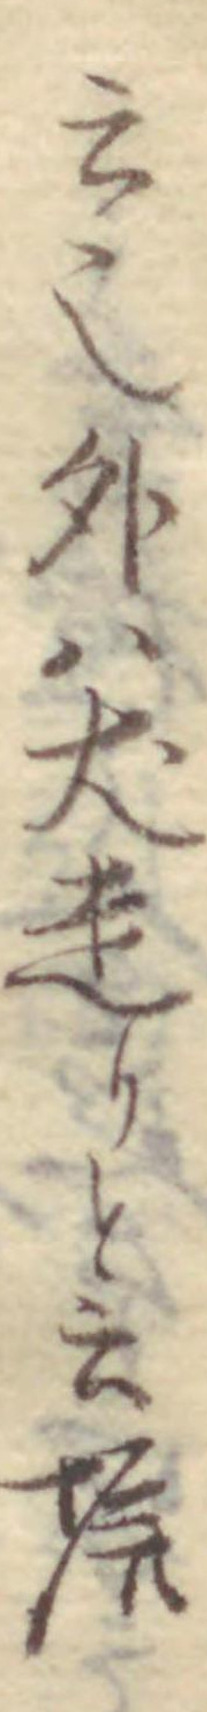云也外ハ犬走りと云塀
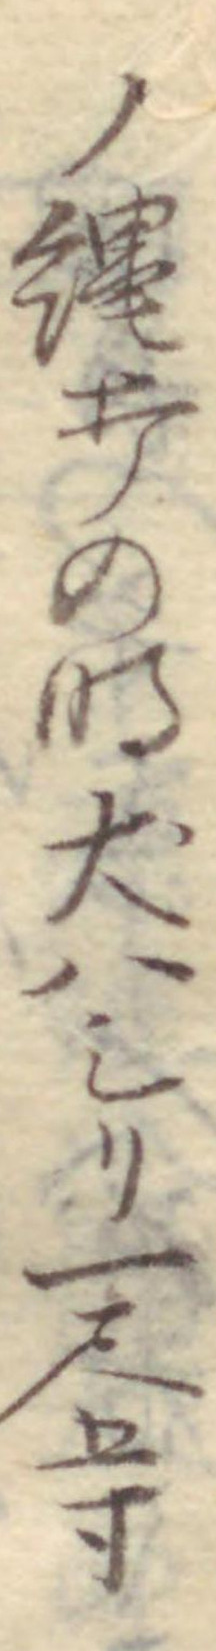ノ縄打の時犬ハシリ一尺五寸
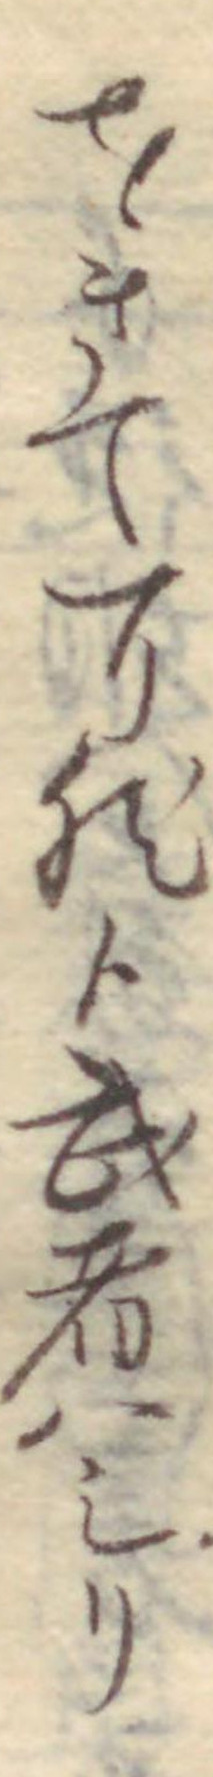をきて可然候武者ハシリ
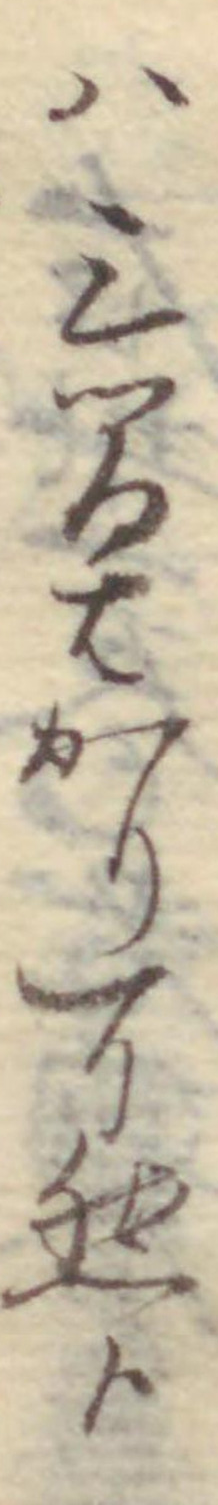ハ三間はかり可然候
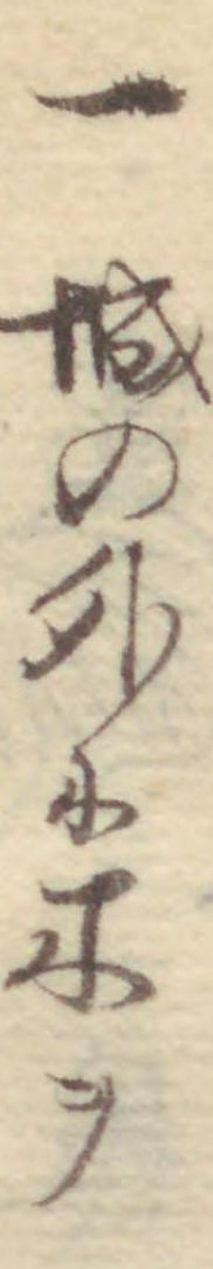一城の外に木ヲ
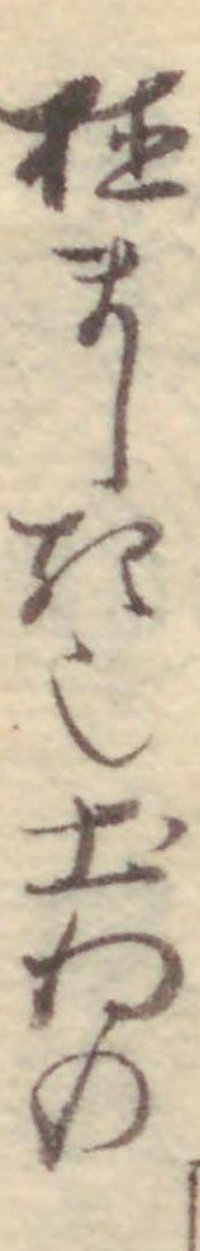植ましき也土ゐの
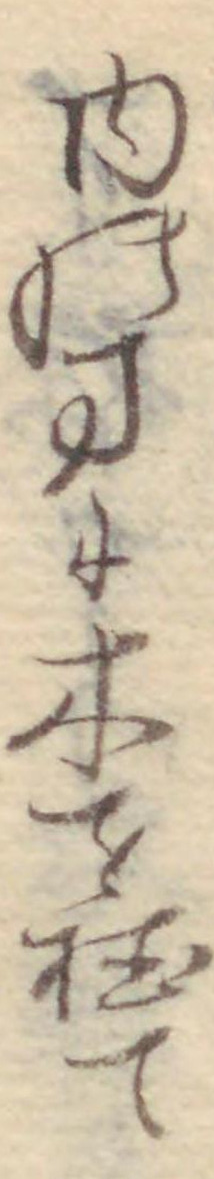内の方に木を植て
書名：鶯宿雑記. 巻199-200
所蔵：国立国会図書館 National Diet Library, JAPAN
